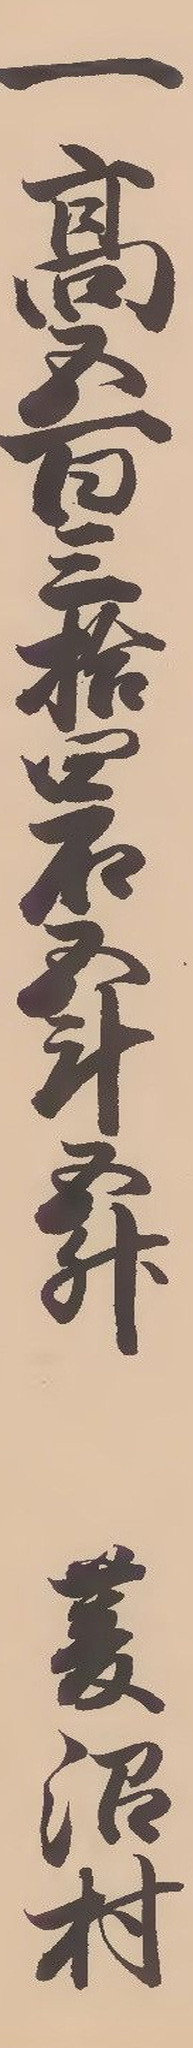一高五百三拾四石五斗五升菱沼村

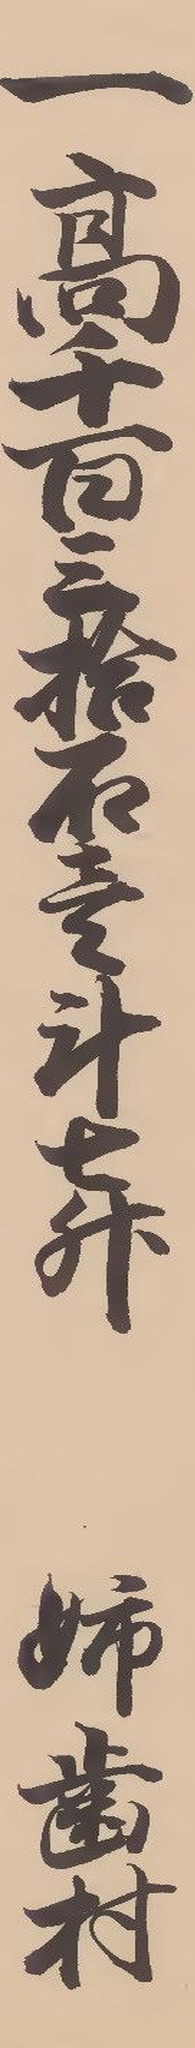一高千百三拾石壱斗七升姉歯村
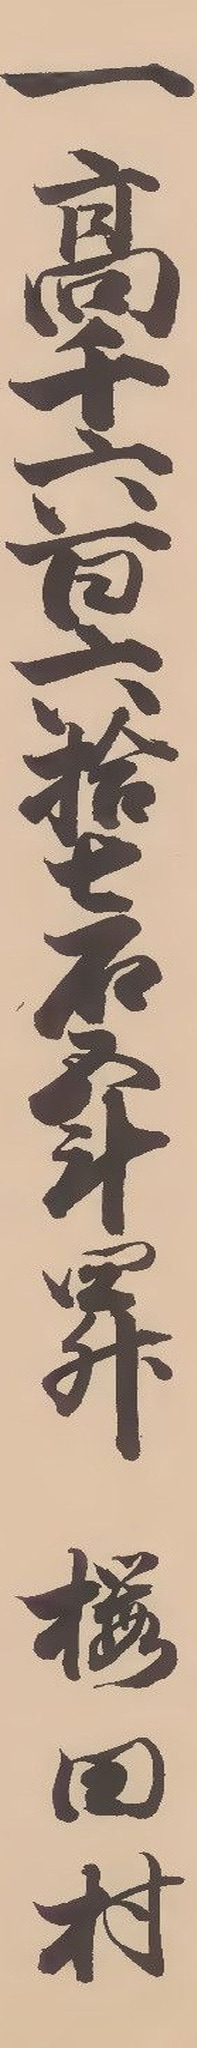一高千六百六拾七石五斗四升桜田村
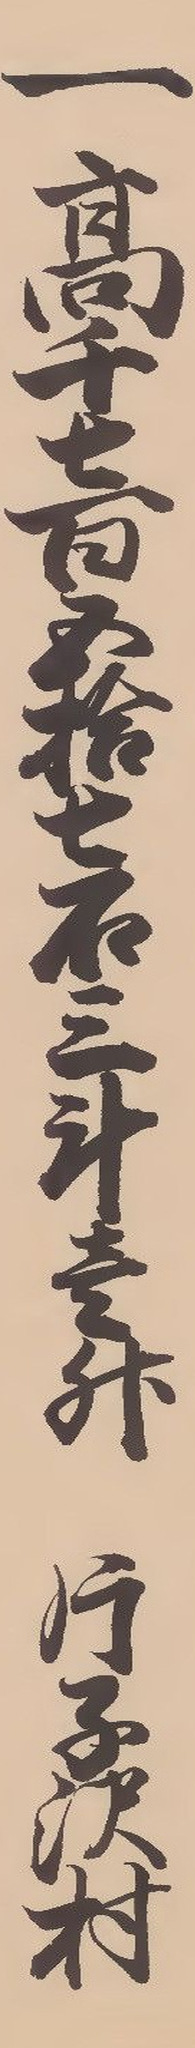一高千七百五拾七石三斗壱升片子沢村
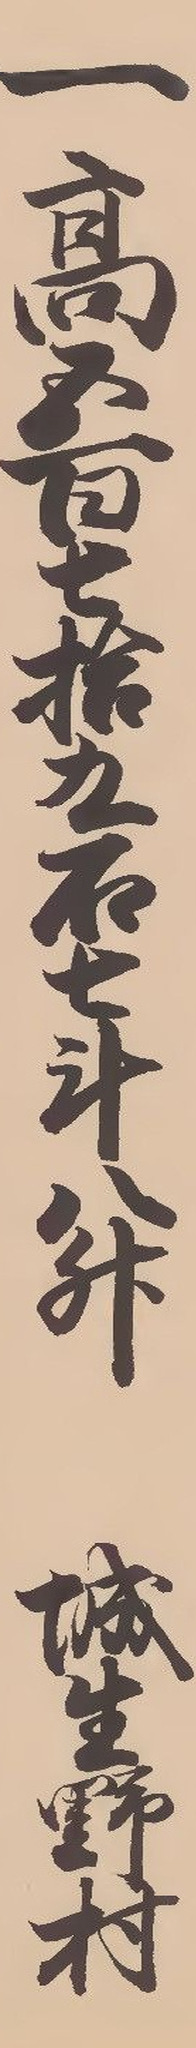一高五百七拾九石七斗八升城生野村
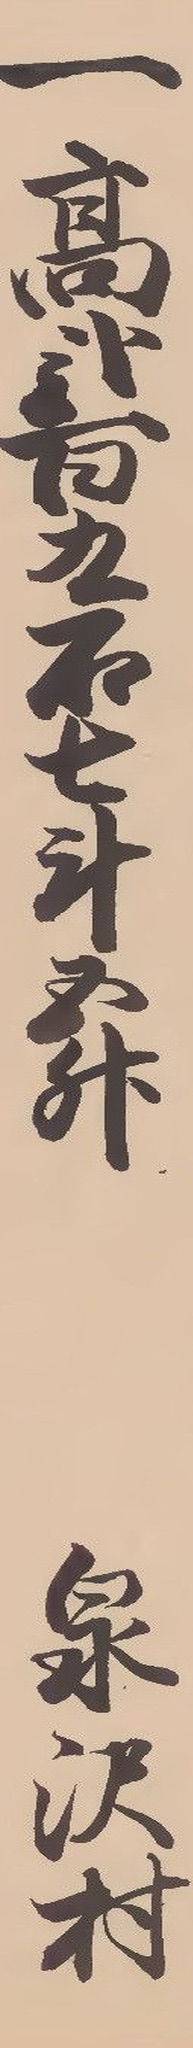一高弐百九石七斗五升泉沢村
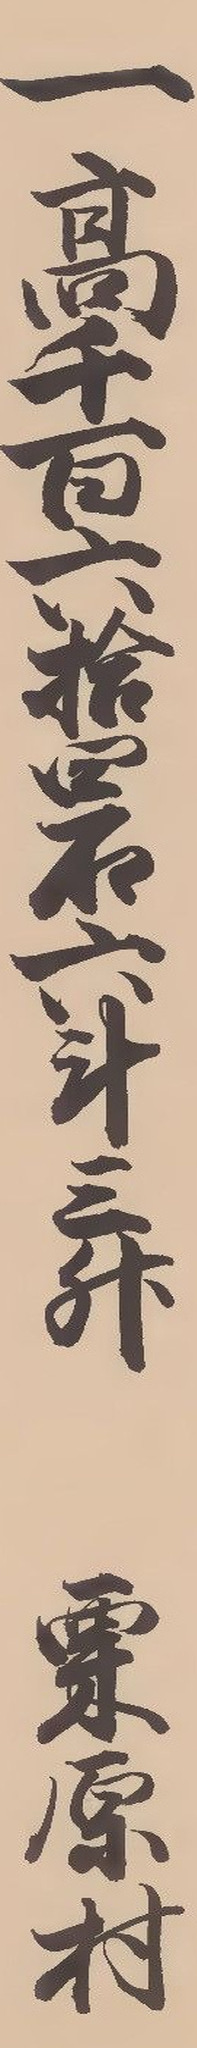一高千百六拾四石六斗三升栗原村
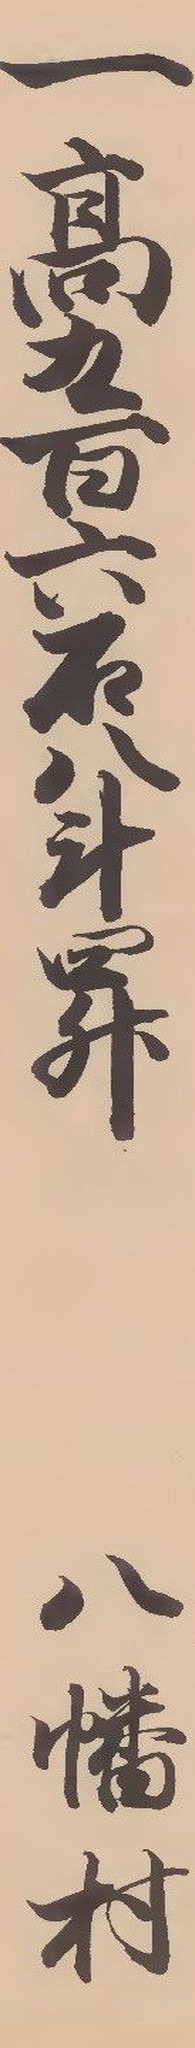一高九百六石八斗四升八幡村
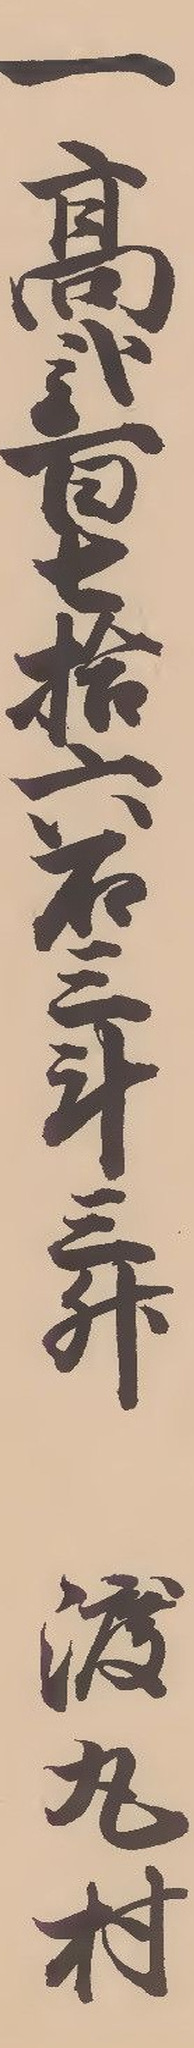一高弐百七拾六石三斗三升渡丸村

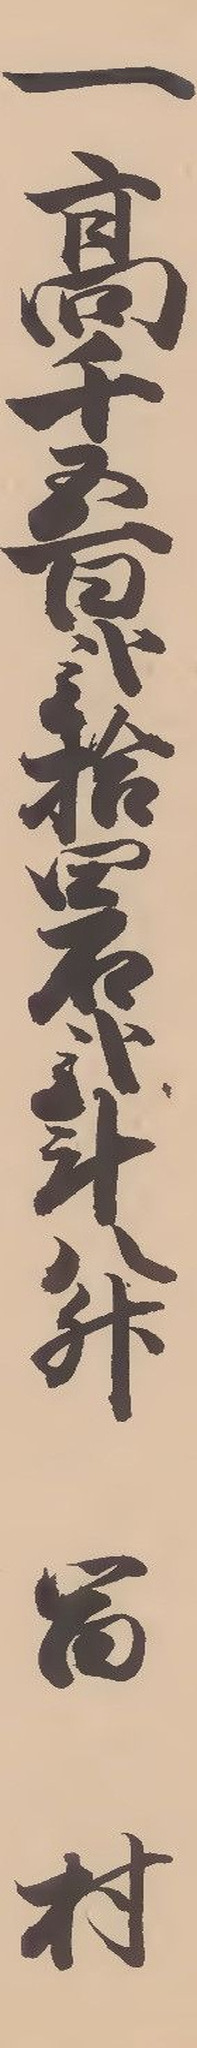一高千五百弐拾四石弐斗八升富村
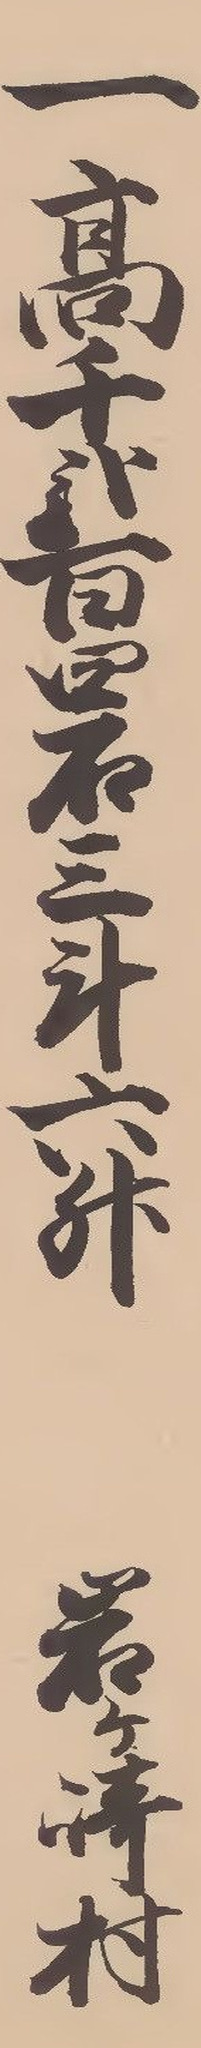一高千弐百四石三斗六升岩ヶ崎村
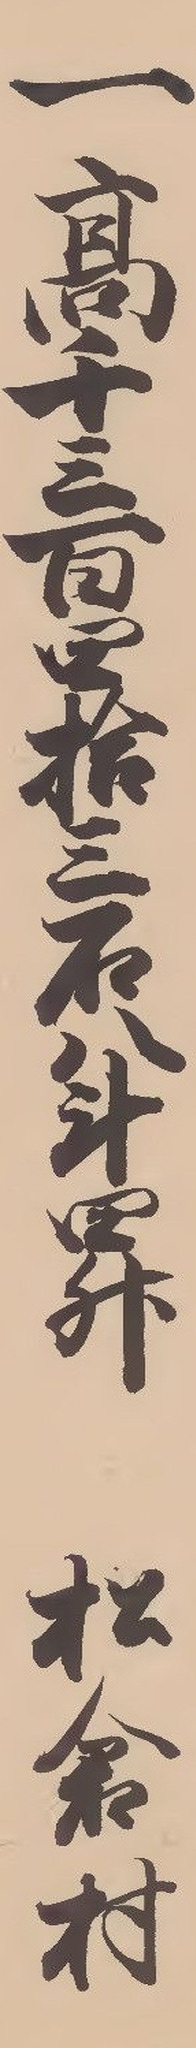一高千三百四拾三石八斗四升松倉村
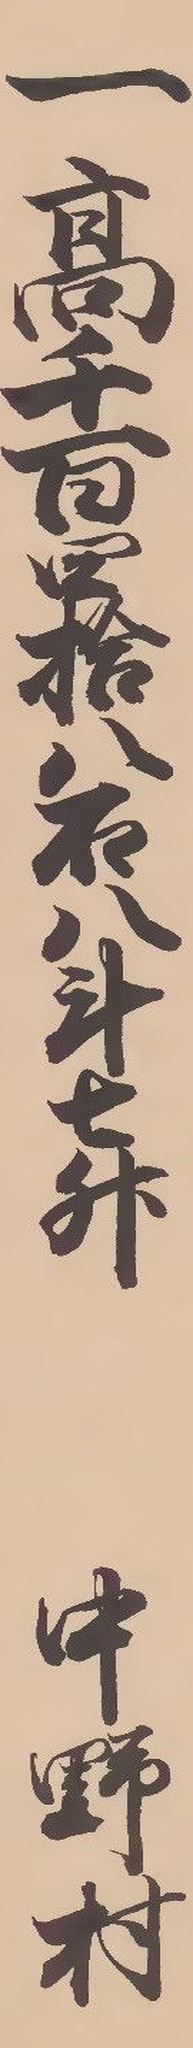一高千百四拾八石八斗七升中野村
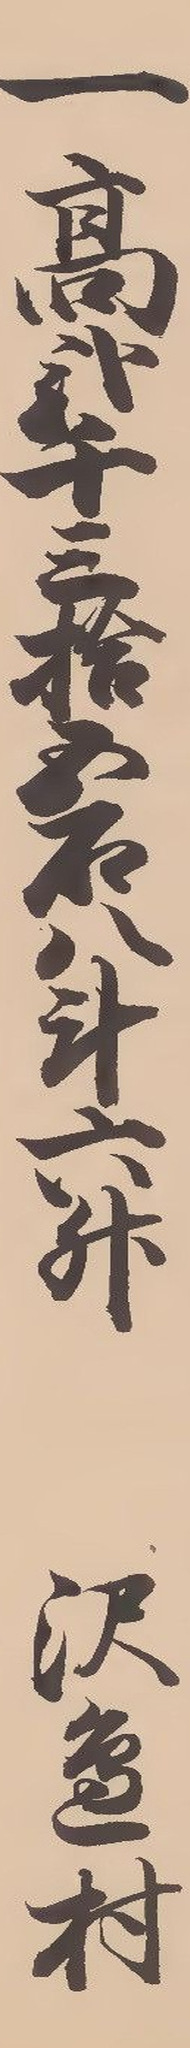一高弐千三拾五石八斗六升沢辺村
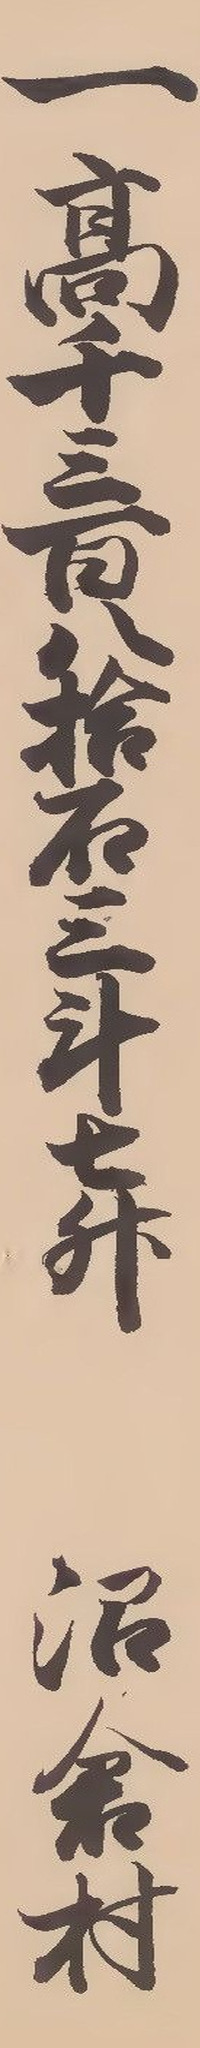一高千三百八拾石三斗七升沼倉村
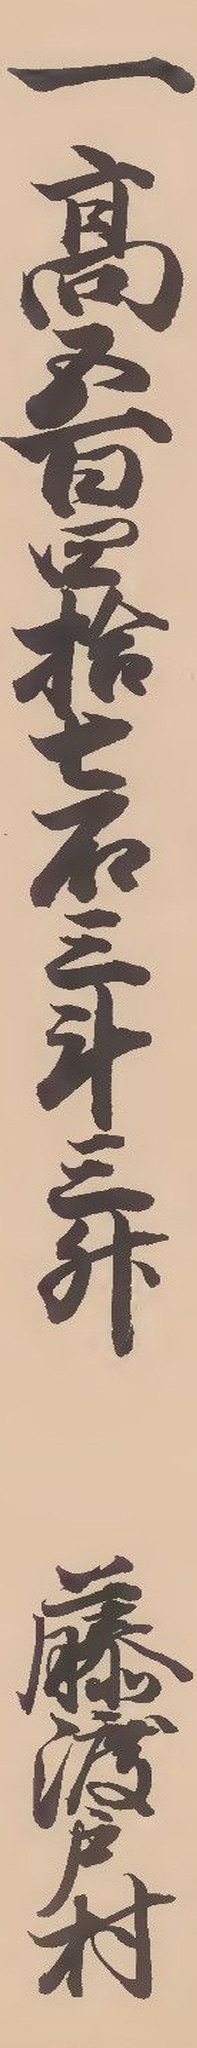一高五百四拾七石三斗三升藤渡戸村
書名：陸奥国郷帳　５
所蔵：国立公文書館 National Archives of Japan
